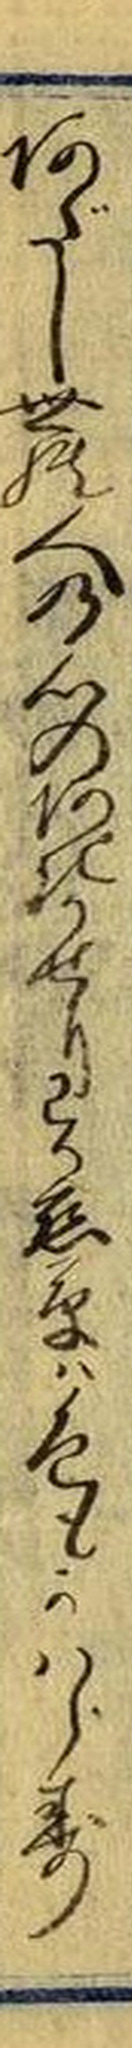あだし世の人の心のあきかせにわか恋草は色もかはらす
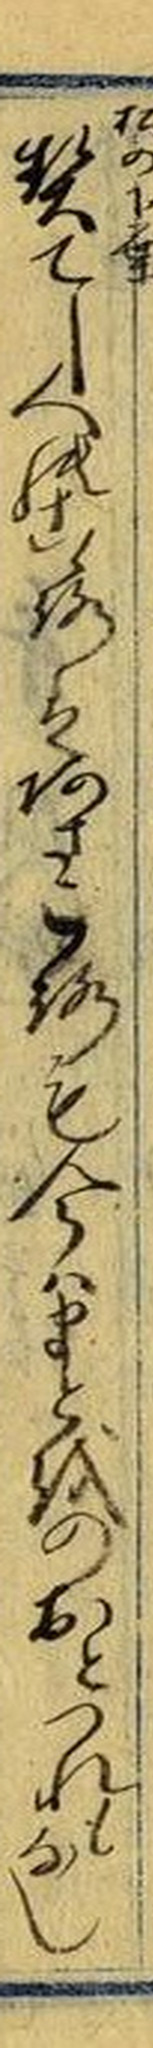契てし人のこころはあさころも今はまとをのおとつれもなし
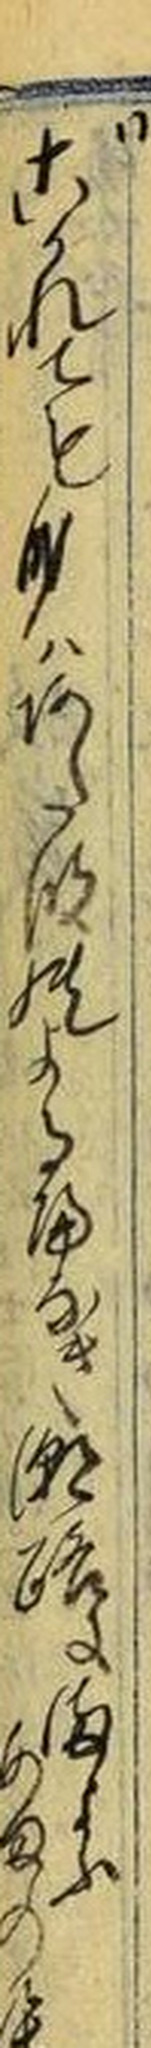こかれても身はあた波のよるへなき瀬路にまよふあまの捨舟
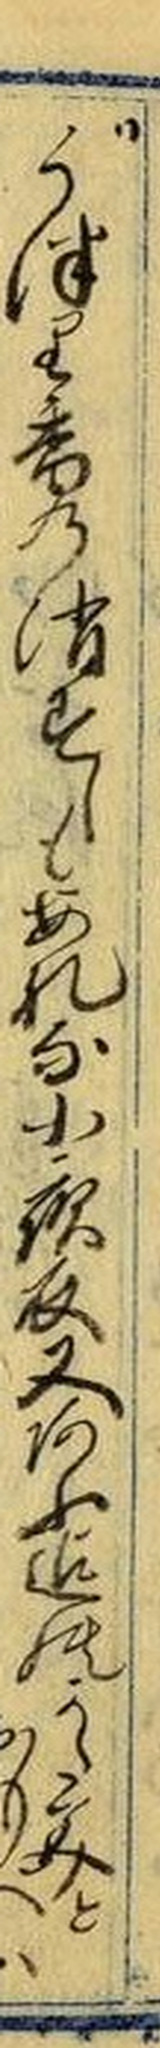うつり香の消すしもあれな小夜衣又あふ迄のうらみとおもへは
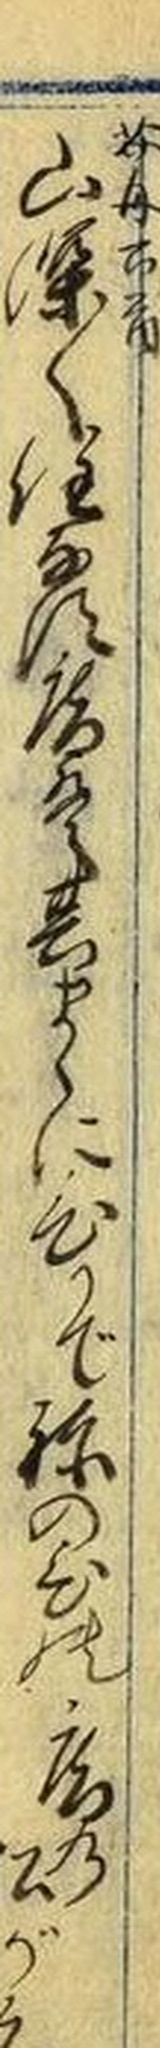山深く住なす房は其ままにひかでねのひの房の松がえ
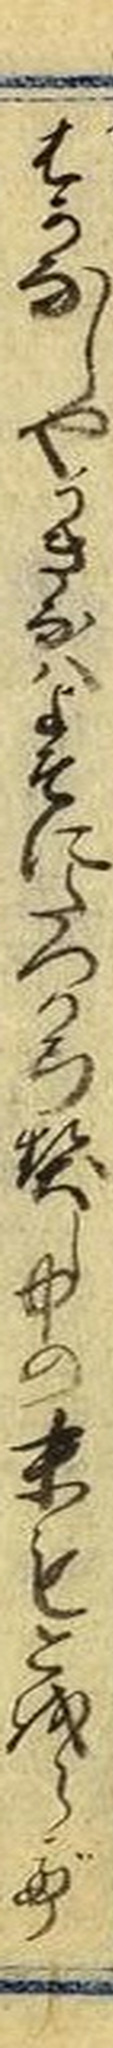はかなしやうきなはよそにたつは弓契し中の末もとをらで
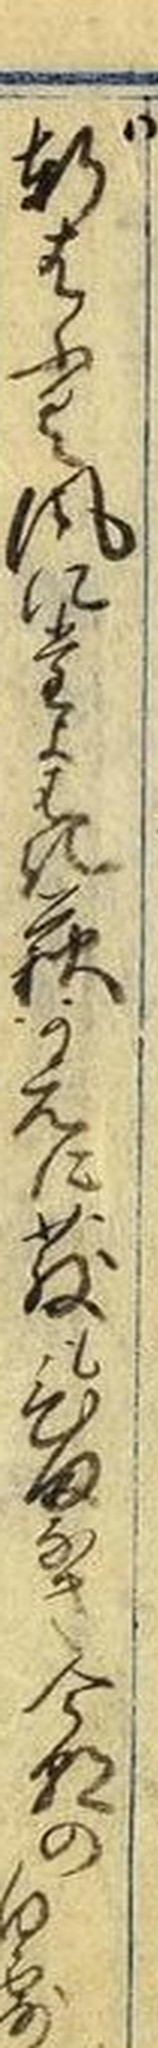軒はふく風にたよはき萩かえに散もひまなき今朝の白露
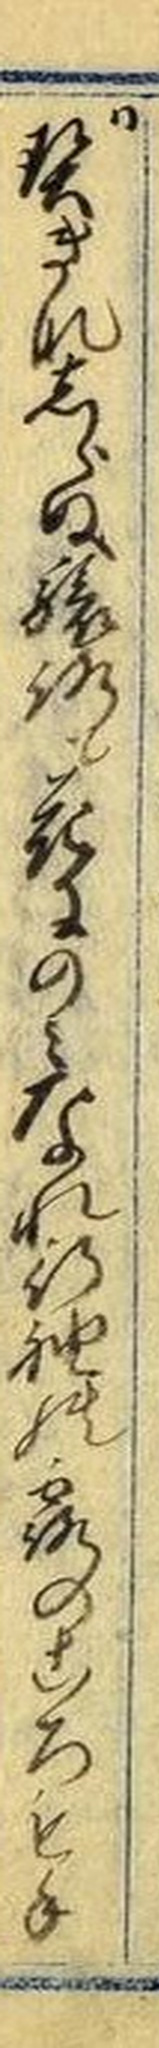契きれしらぬ旅路も花にのみなれ行袖の露のころも手

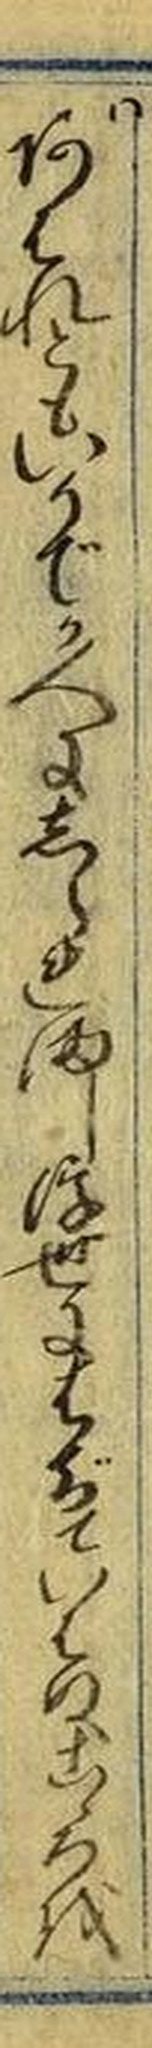あはれともいかでか人にしられまし浮世にはぢていはぬこゝろを
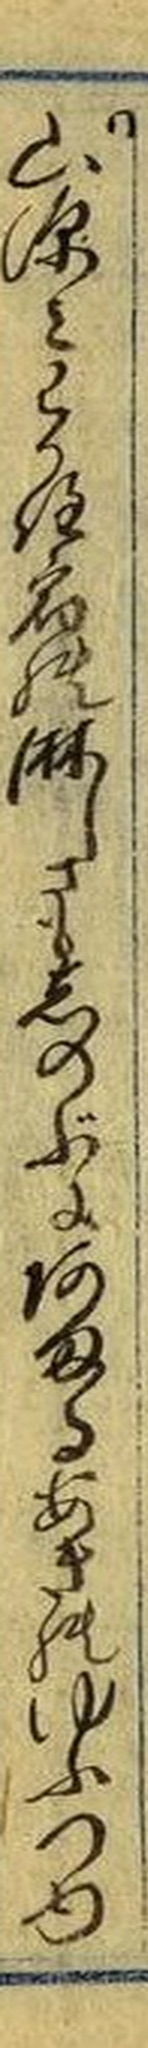山深みわか住宿の淋しさもしのぶにあまるあきのゆふつや
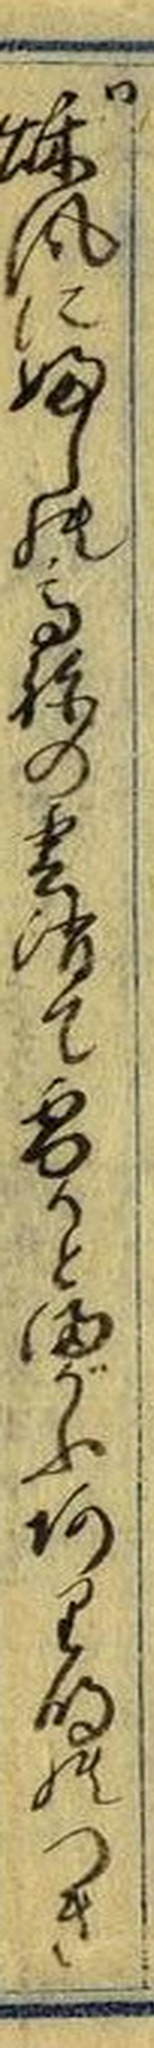秋風にふしの高ねの雲消て雪かとまがふあり明のつき
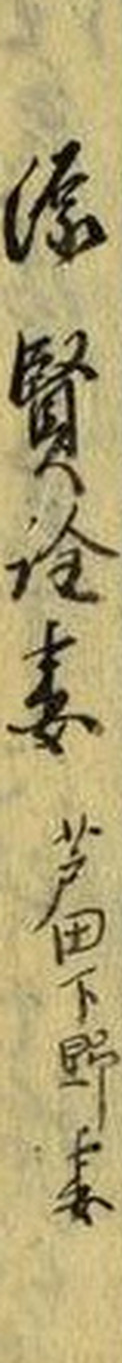源賢詮妻芦田下野妻
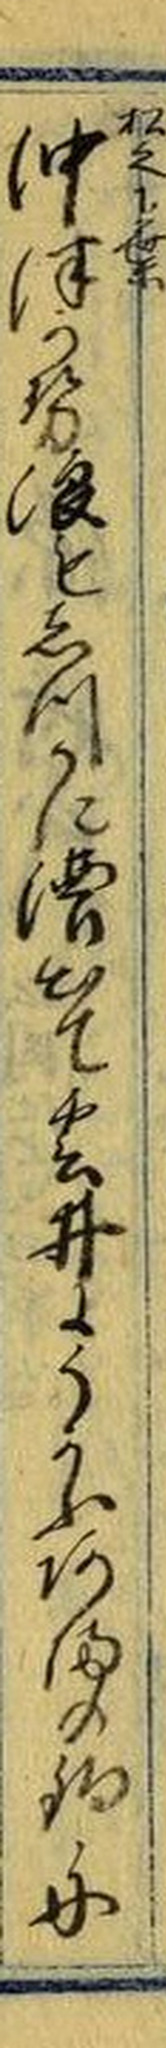沖津かせ浪もしつかに漕出て雲ゐにうかふあまの釣舟
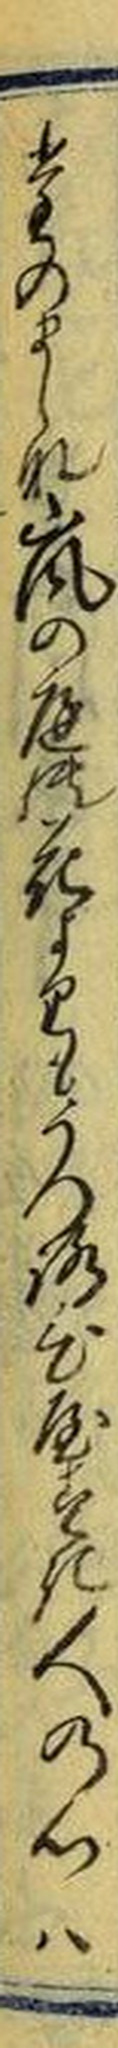たのましな嵐の庭の花よりもうつろひやすき人の心は
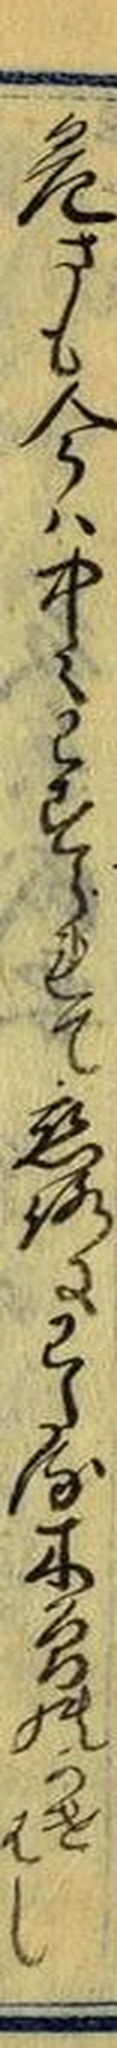危さも今は中々わすられて恋路にわたる木曽のかけはし
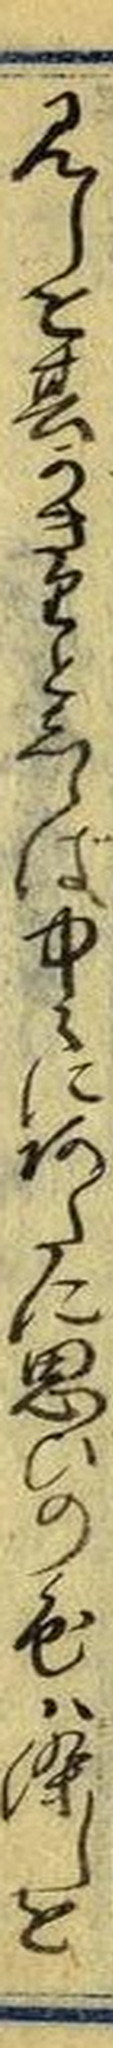見しを其かきりとしらば中々にあたに思ひの色は深しを
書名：温古集 三巻
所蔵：福井県文書館 Fukui Prefectural Archives
